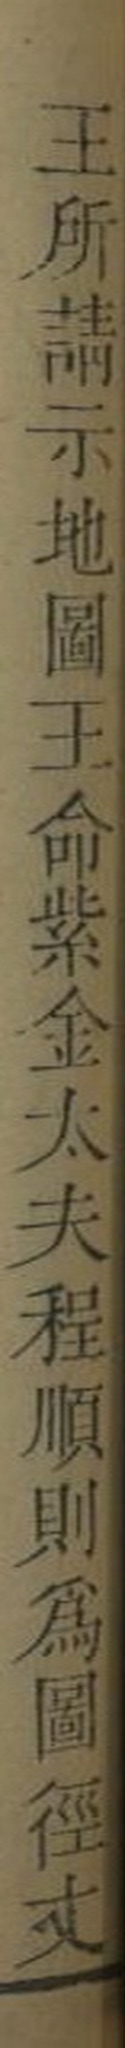王所請示地図王命紫金太夫程順則為図径丈
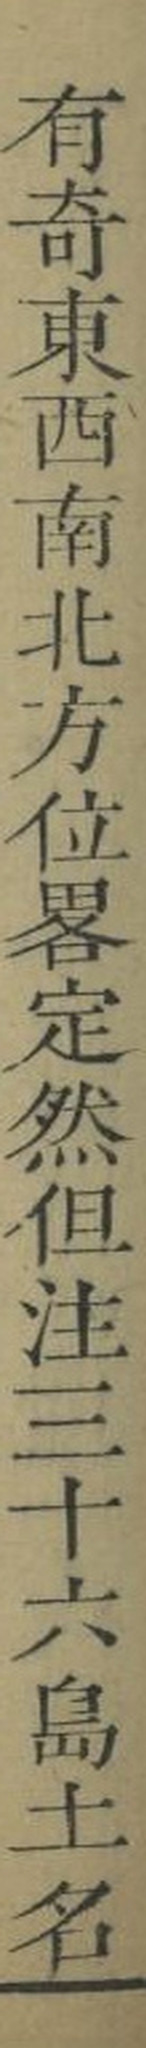有奇東西南北方位略定然但注三十六島土名
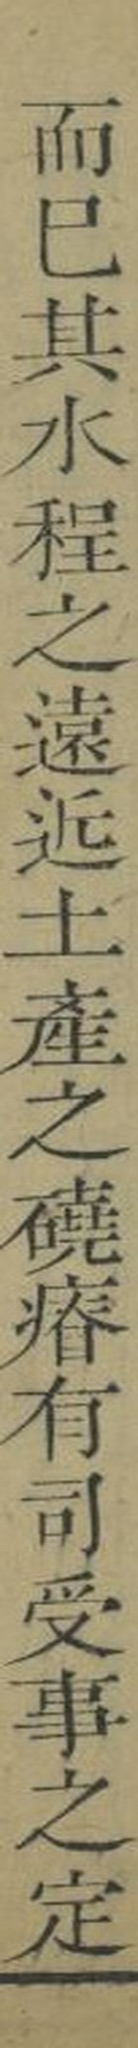而巳其水程之遠近土産之磽瘠有司受事之定
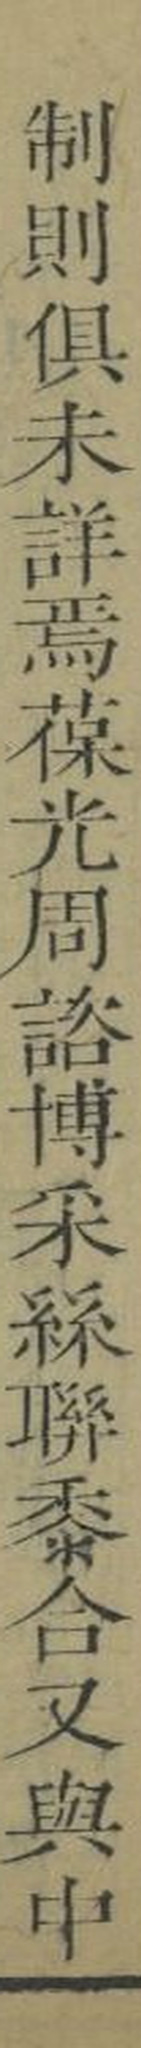制則俱未詳焉葆光周諮博采糸聯黍合又与中
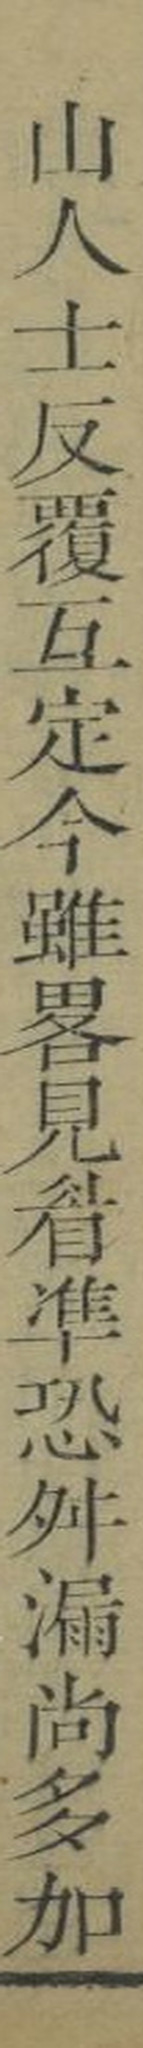山人士反覆互定今雖略見眉準恐舛漏尚多加
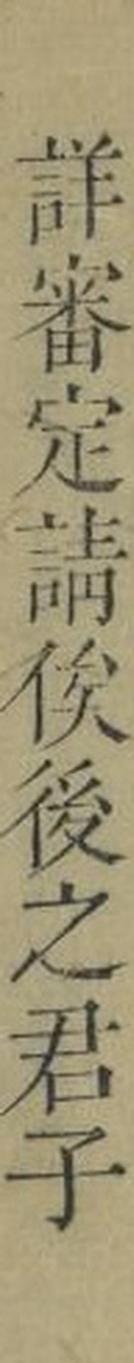詳審定請俟後之君子
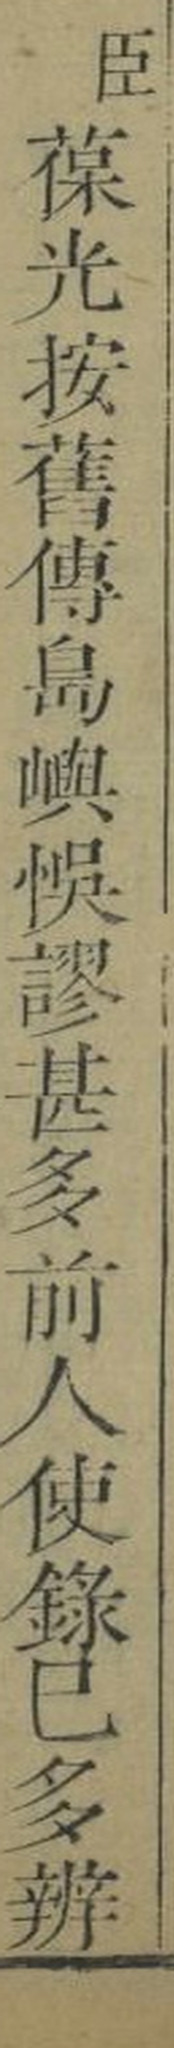臣葆光按旧伝島嶼悞謬甚多前人使錄巳多弁
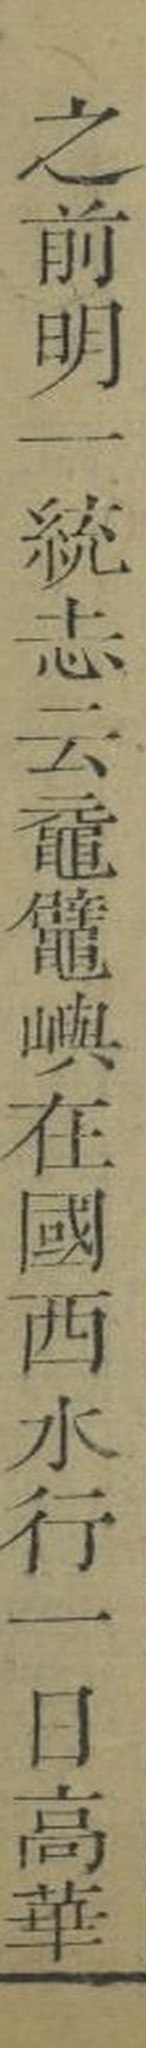之前明一統志云黿鼊嶼在国西水行一日高華

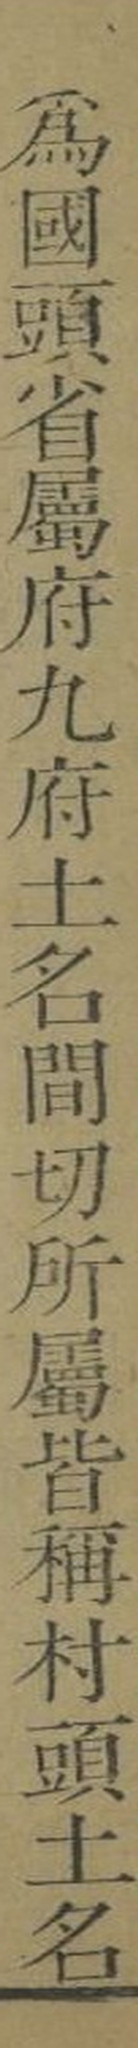為国頭省属府九府土名間切所属皆称村頭土名
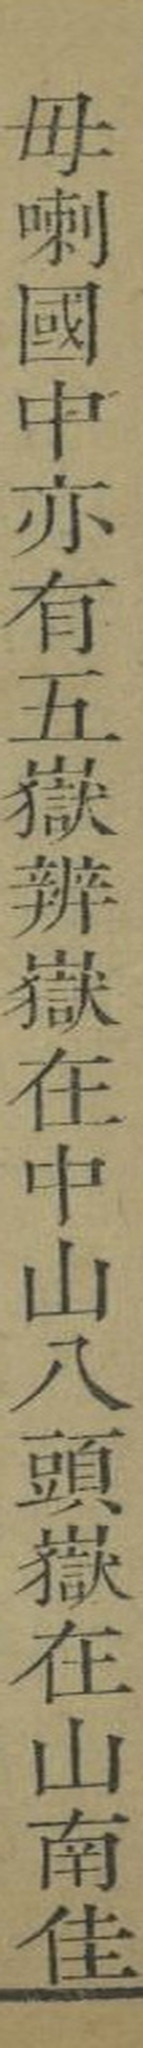母喇国中亦有五岳弁岳在中山八頭岳在山南佳
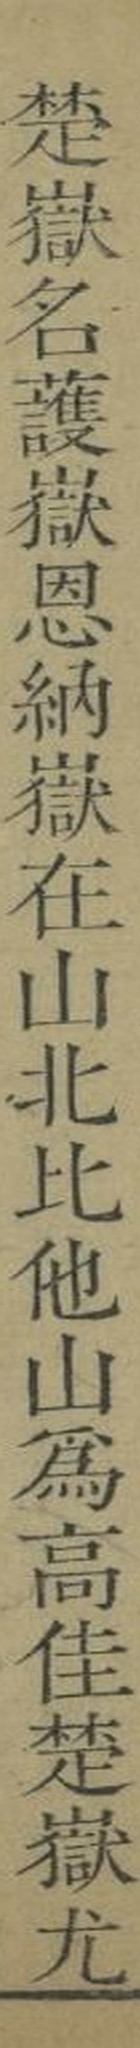楚岳名護岳恩納岳在山北比他山為高佳楚岳尤
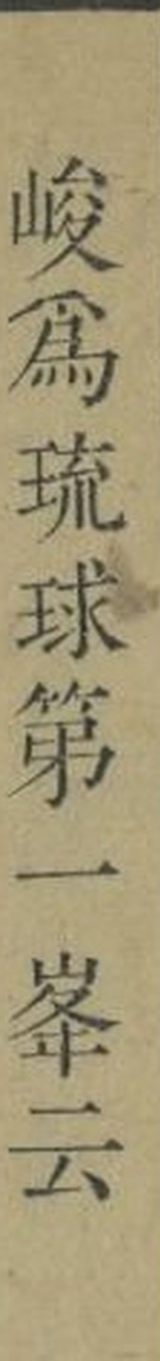峻為琉球第一峰云

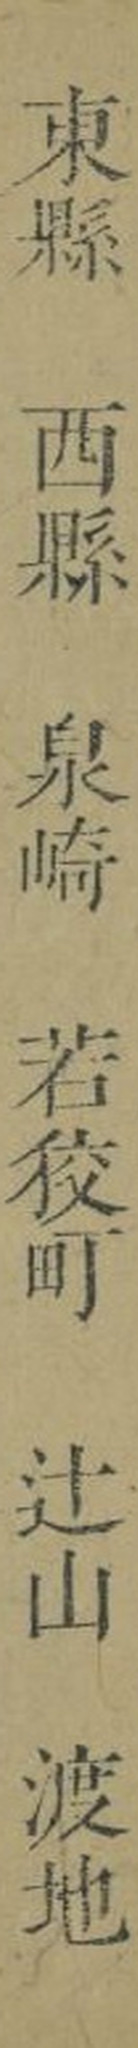東県西県泉崎若狡町辻山渡地

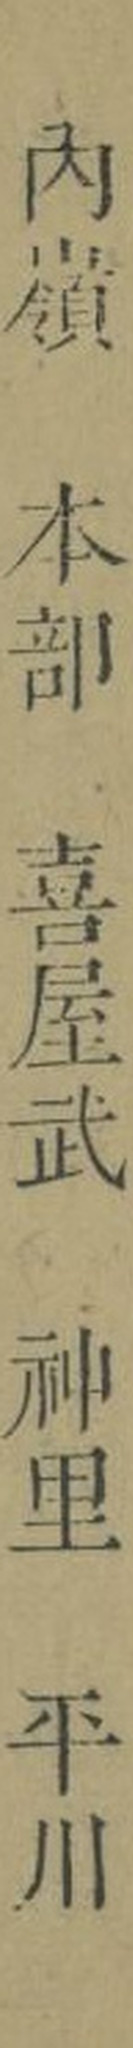内嶺本部喜屋武神里平川
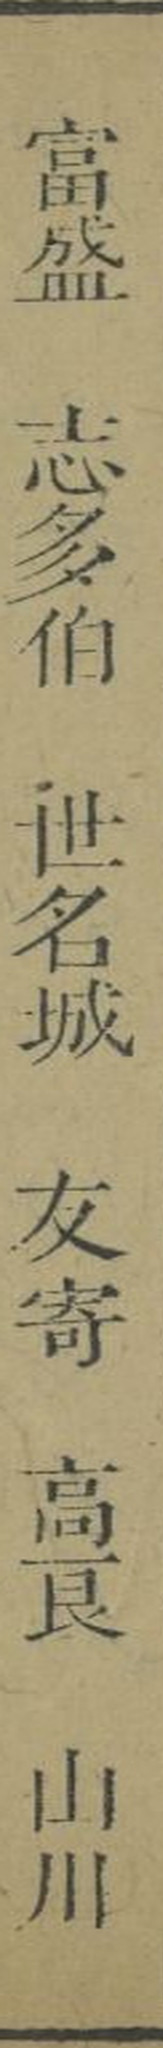富盛志多伯世名城友寄高良山川
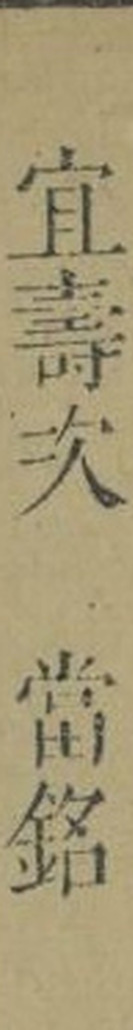宜寿次当銘
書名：中山伝信録 巻四
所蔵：University of the Ryukyus Library
